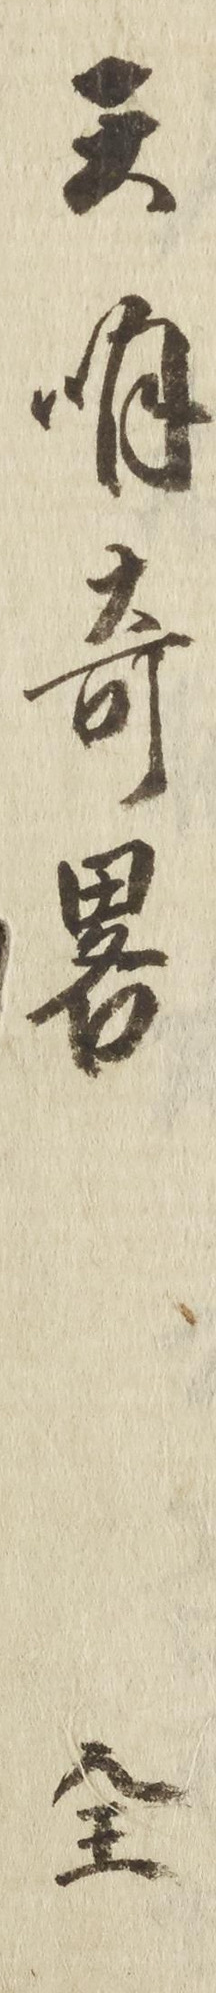天明奇略全

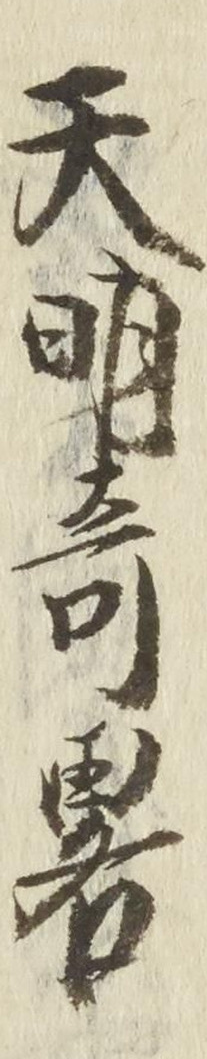天明奇略
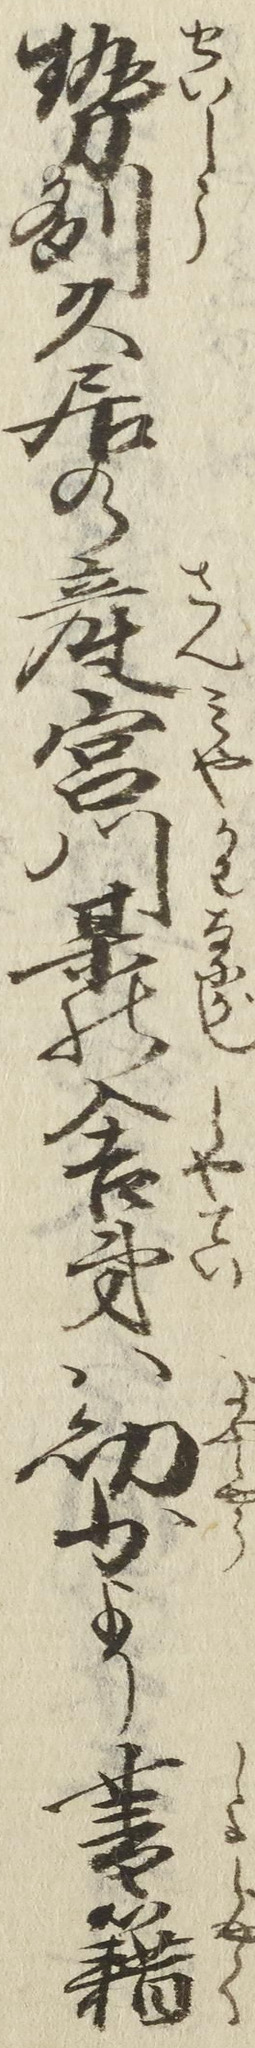勢州久居の産宮川某の舎弟は幼少より書籍
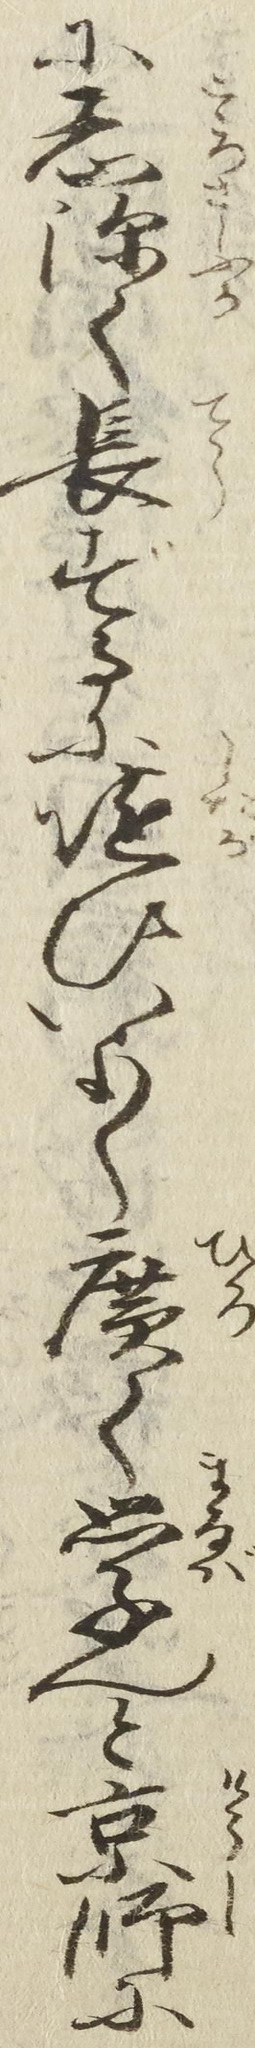に志深く長ずるに随ひいよ〳〵広く学んと京師に
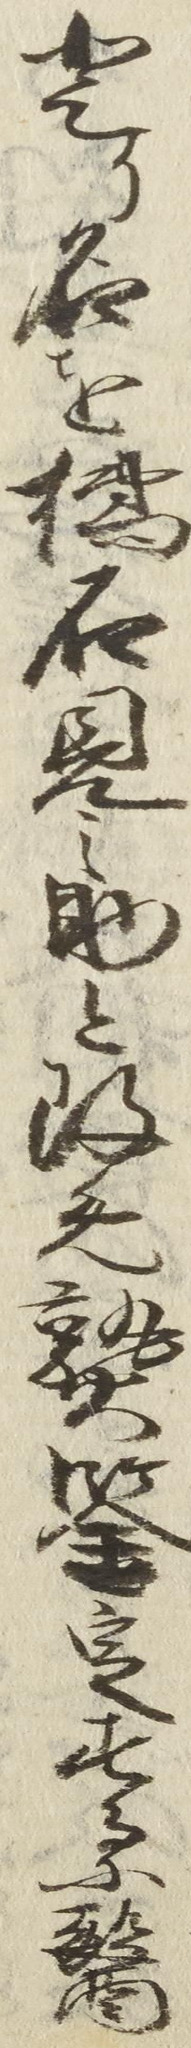登り名を橘石見之助と改め熟筌定するに医
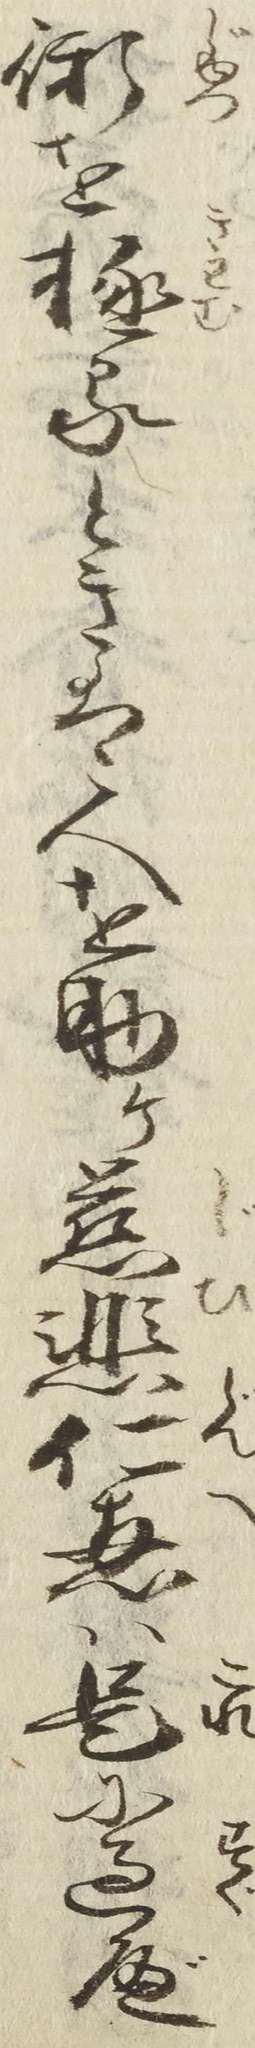術を極るときは人を助ケ慈悲仁恵は是に過べ
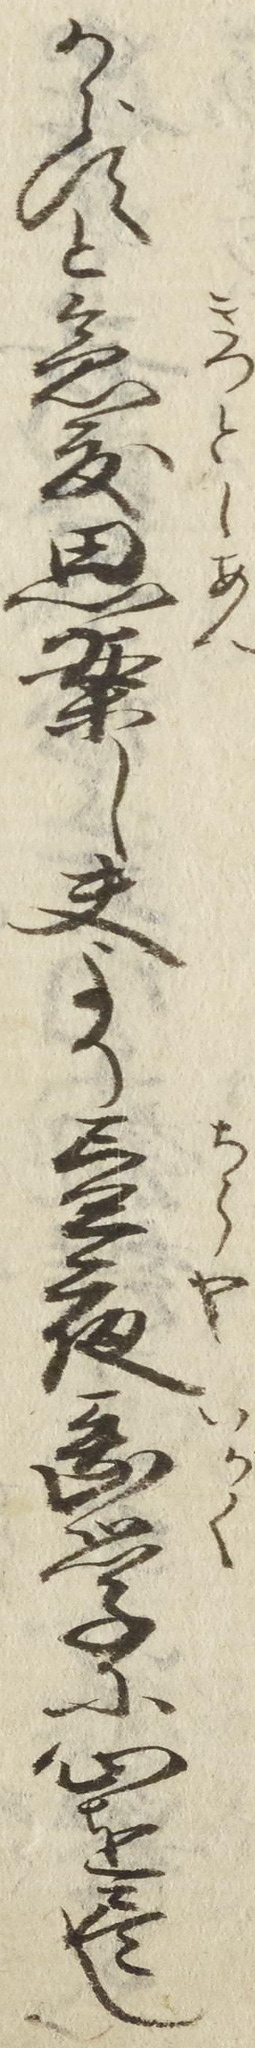からすと急度思案し夫より昼夜医学に心を尽し
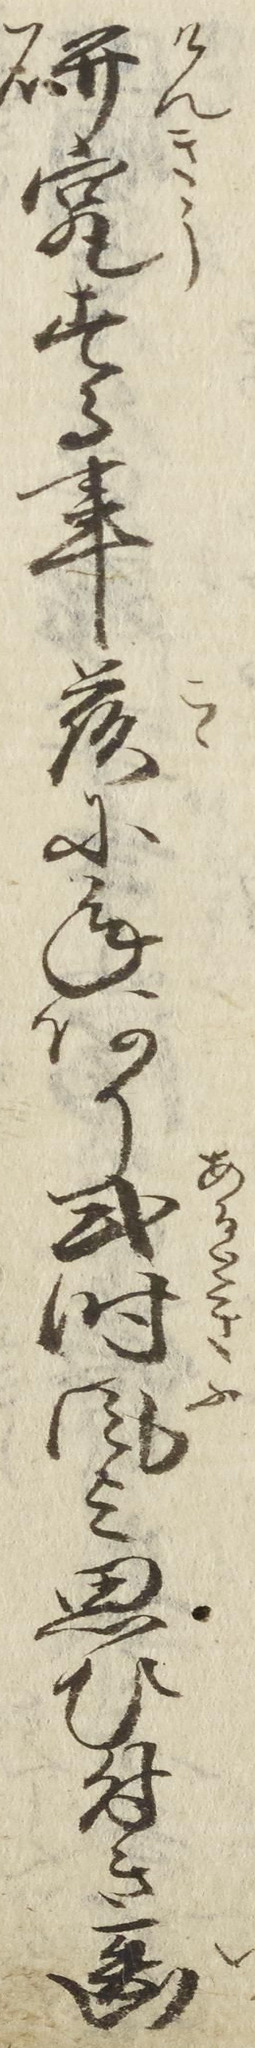研究する事茲に年あり或時風と思ひ付き医
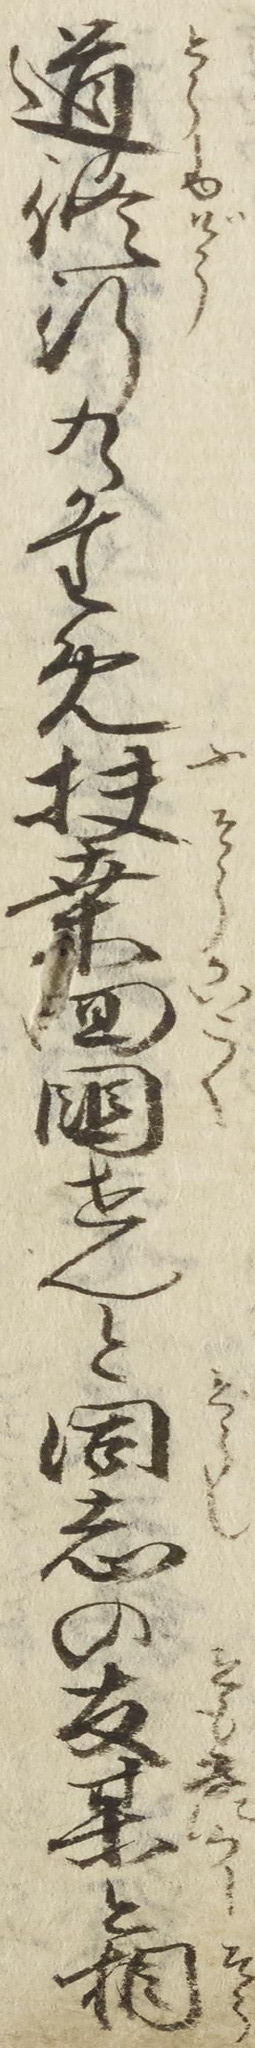道修行のため扶桑回国せんと同志の友某と相

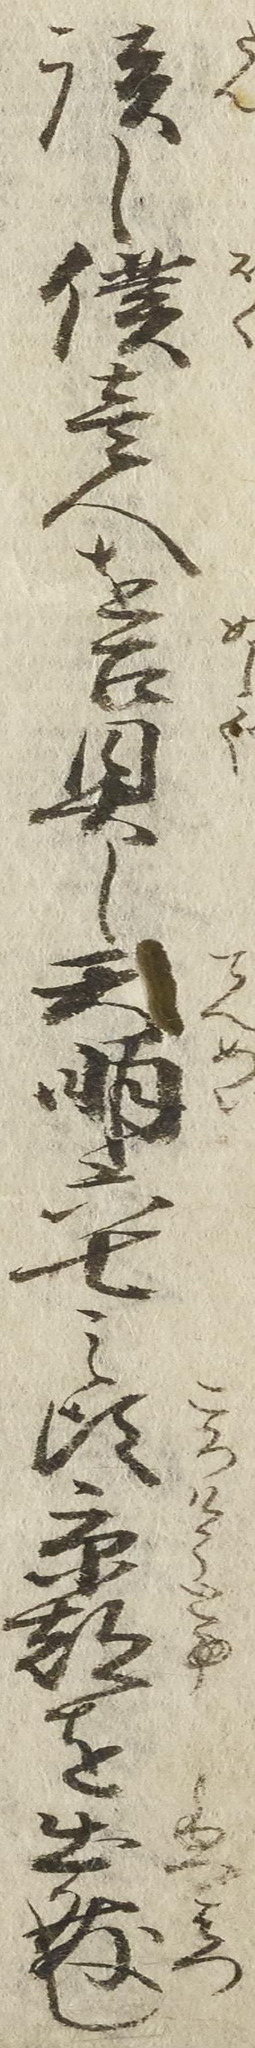談し僕壱人を召具し天明六七之頃京都を出発し
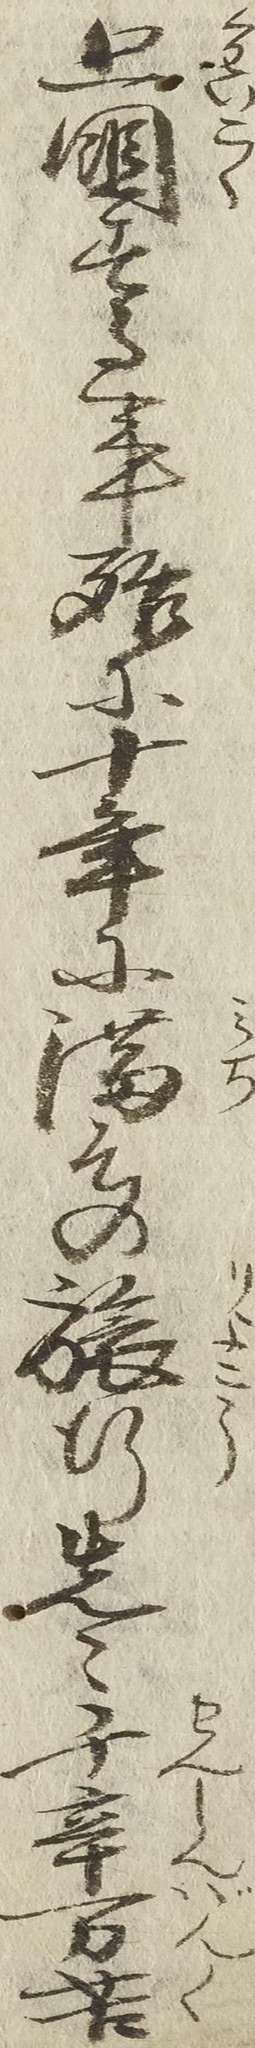廻国する事殆に十年に満その旅行先〻千辛万苦
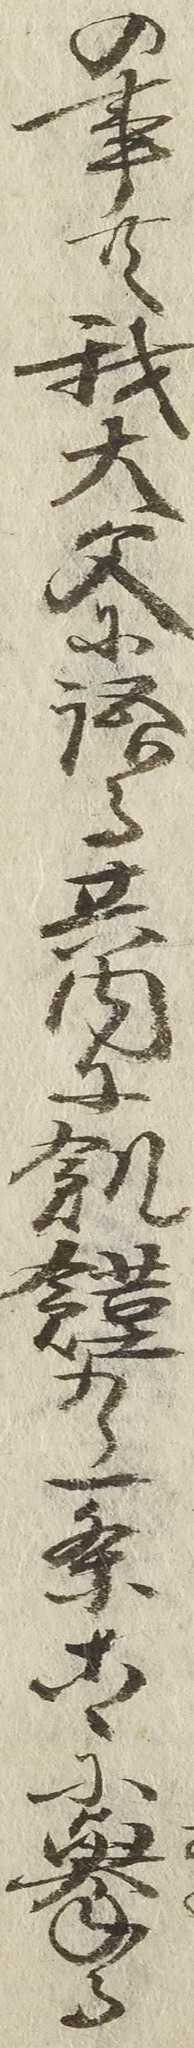の事共我大父に語る其内に飢饉の一条こゝに挙る
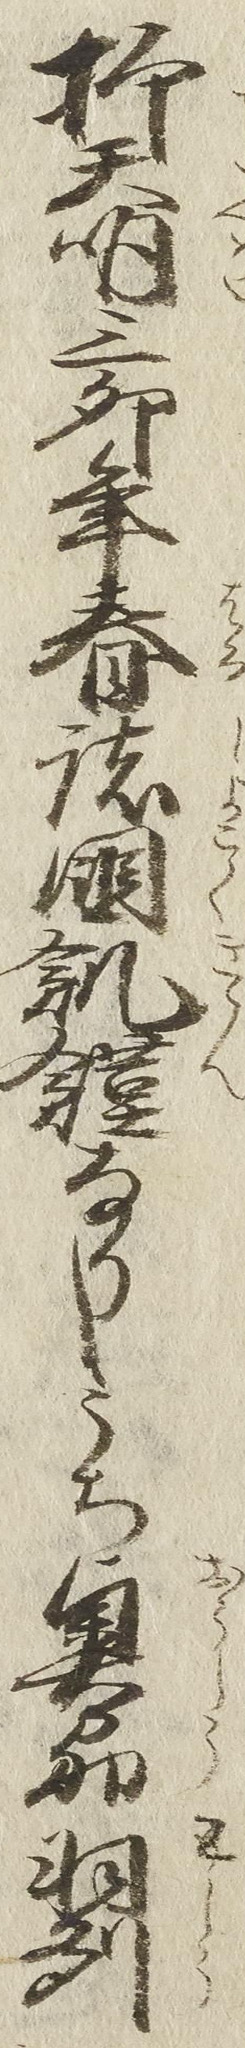抑天明三卯年春諸国飢饉なりしうち奥州羽州
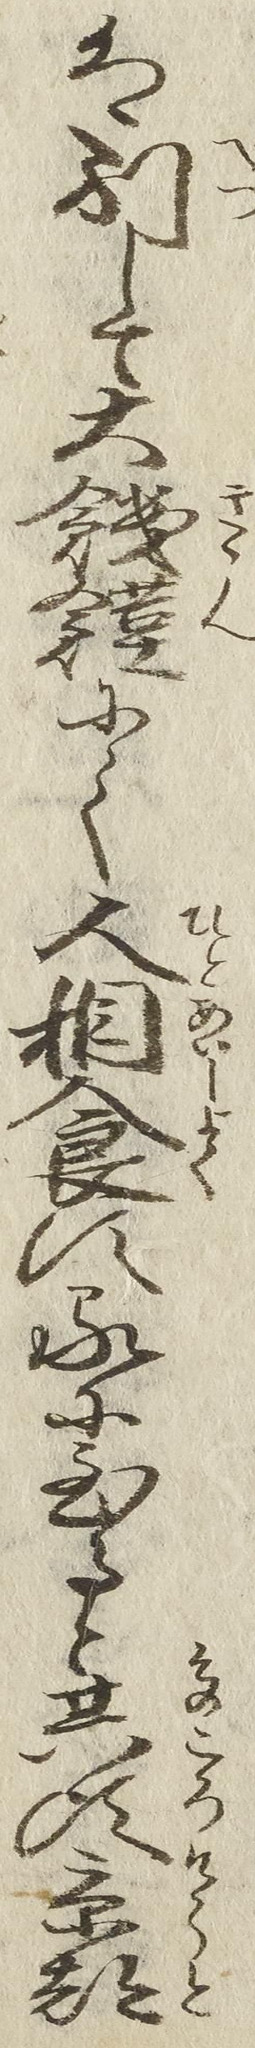は別して大飢饉にて人相食するに至ると其頃京都
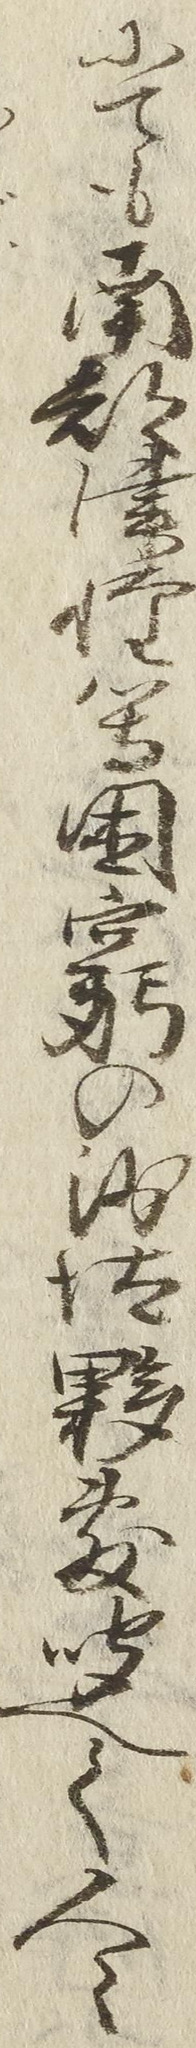にても南部津軽等困窮の沙汰夥敷聞へて人〻
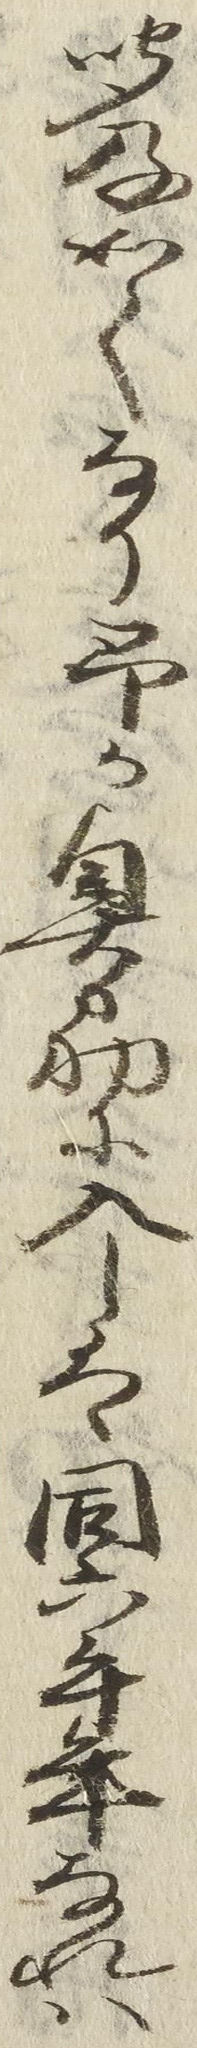聞及如くなり予か奥州に入しは同六午年なれは
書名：天明奇畧　全
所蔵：東京大学地震研究所図書室 Earthquake Research Institute Library, The University of Tokyo, JAPAN
